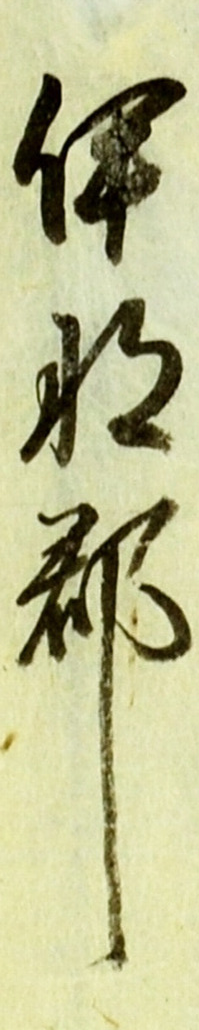伊那郡
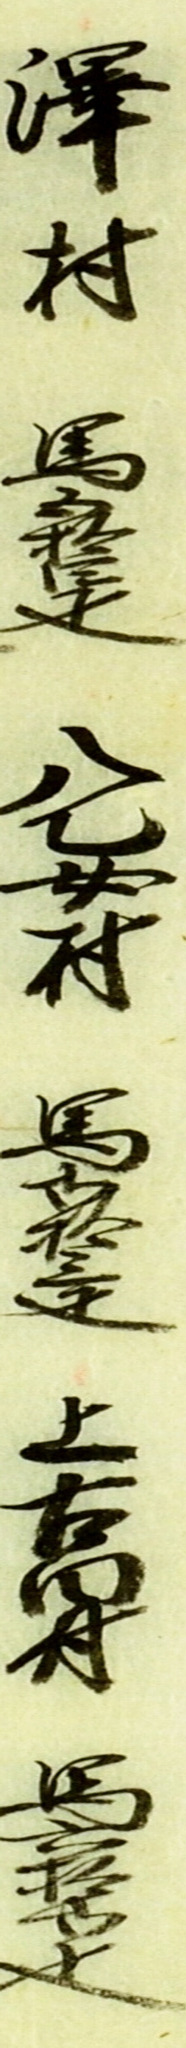沢村馬五拾四疋八乙女村馬弐拾三疋上古田村馬六拾弐疋
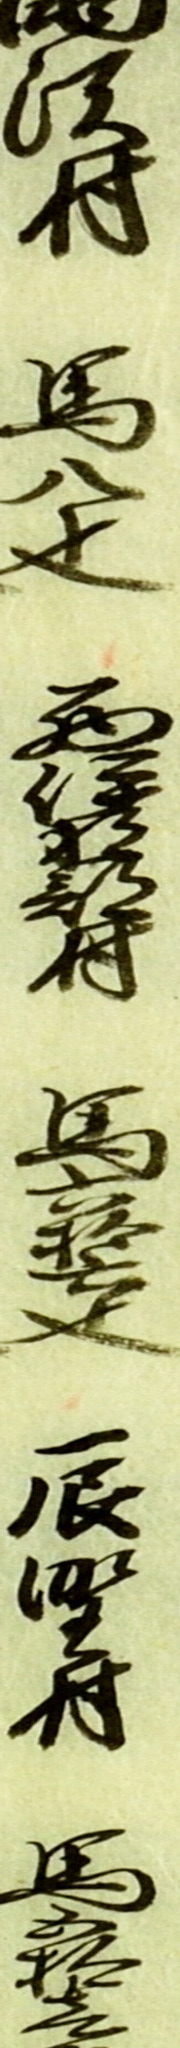雨沢村馬八疋西伊那郡村馬六拾六疋辰野村馬五拾壱疋

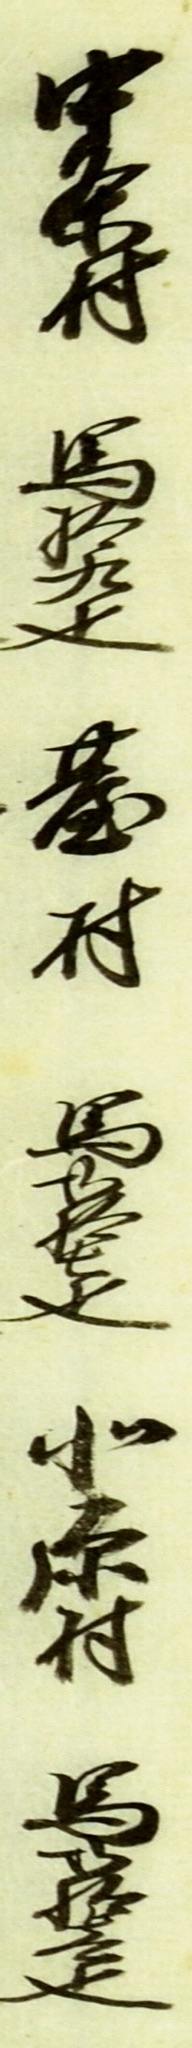中条村馬拾九疋台村馬弐拾七疋北原村馬弐拾壱疋
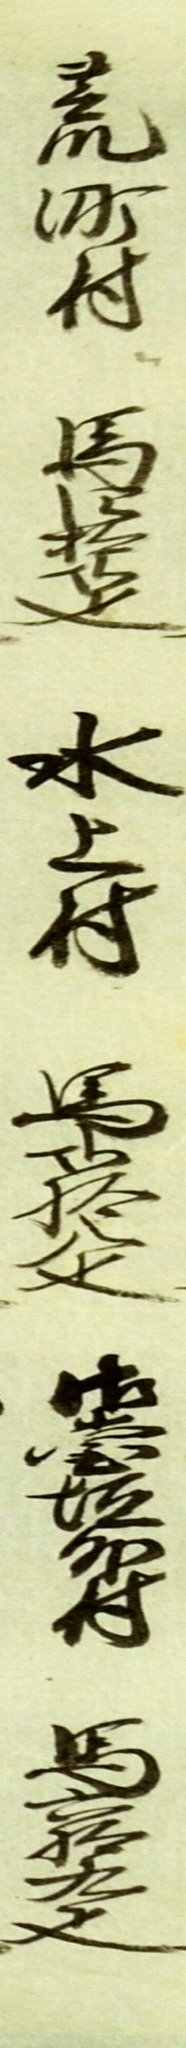荒町村馬四拾弐疋水上村馬弐拾八疋御堂垣外村馬六拾九疋
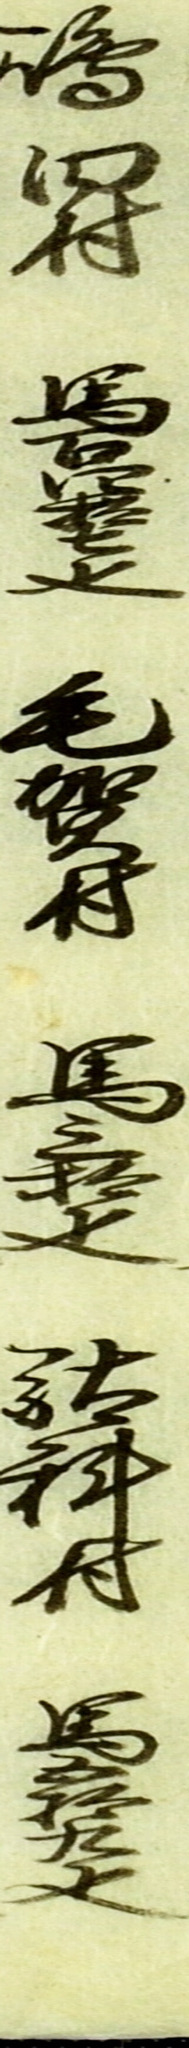嶋田村馬百四拾七疋馬三拾疋駄科村馬五拾九疋
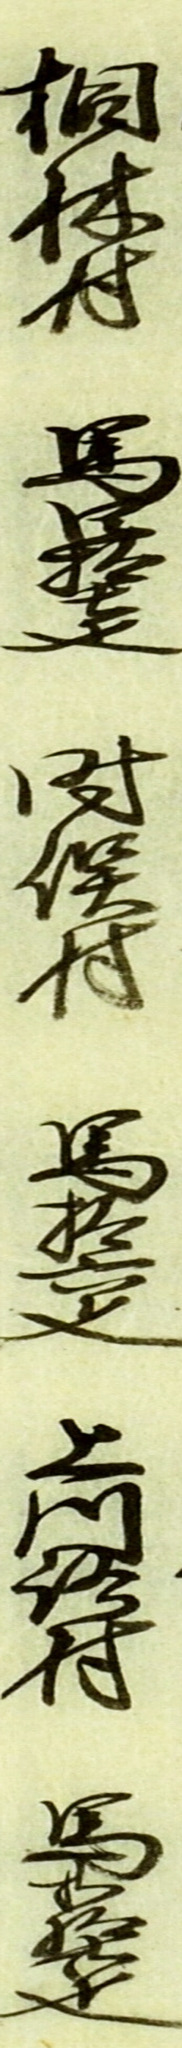桐林村馬四拾七疋時俣村馬拾六疋上川嶋村馬弐拾弐疋
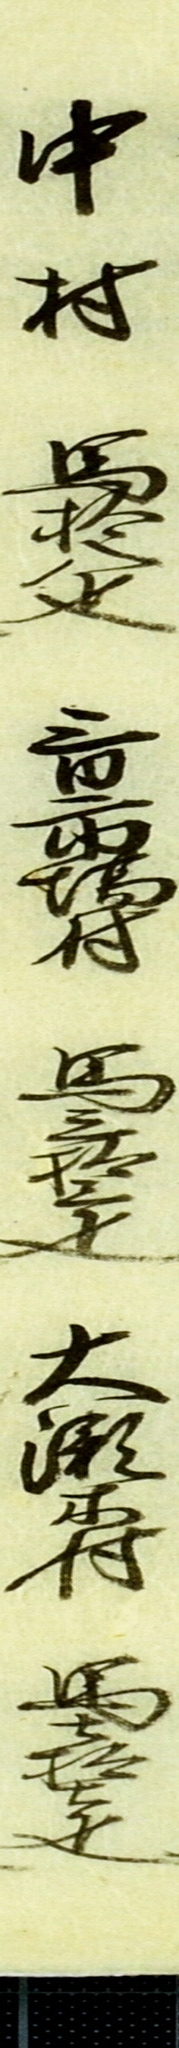中村馬拾八疋三日市場村馬三拾三疋大瀬木村馬七拾七疋
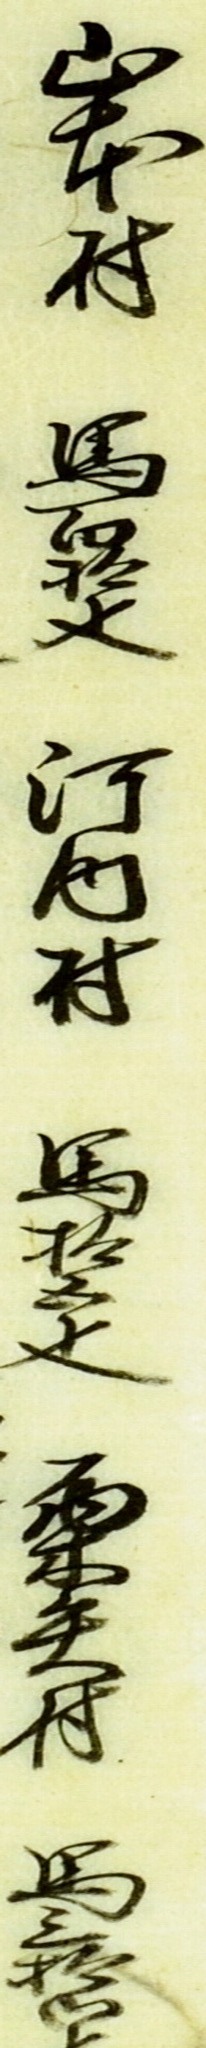山本村馬百拾疋河内村馬拾五疋栗矢村馬三拾弐疋
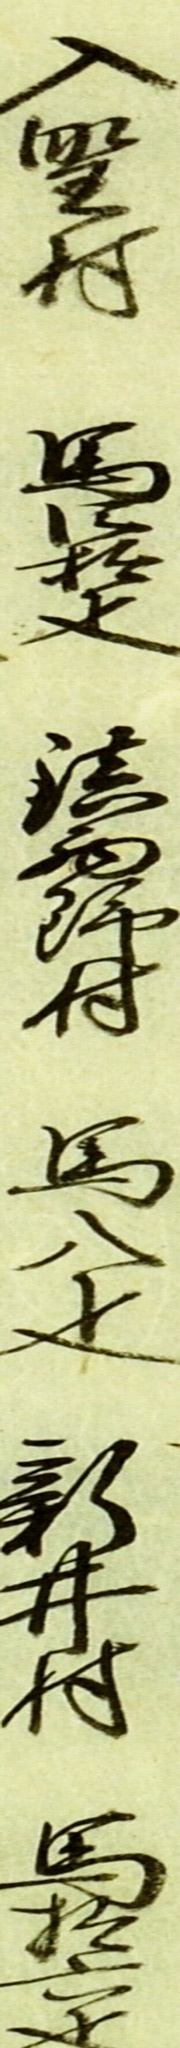入野村馬四拾疋鋳物師村馬八疋新井村馬拾六疋
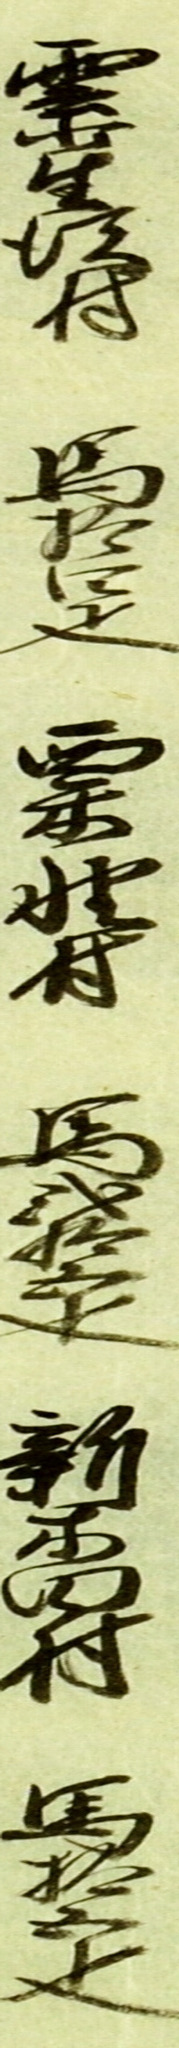雲雀沢村馬拾四疋栗野村馬弐拾五疋新木田村馬拾五疋
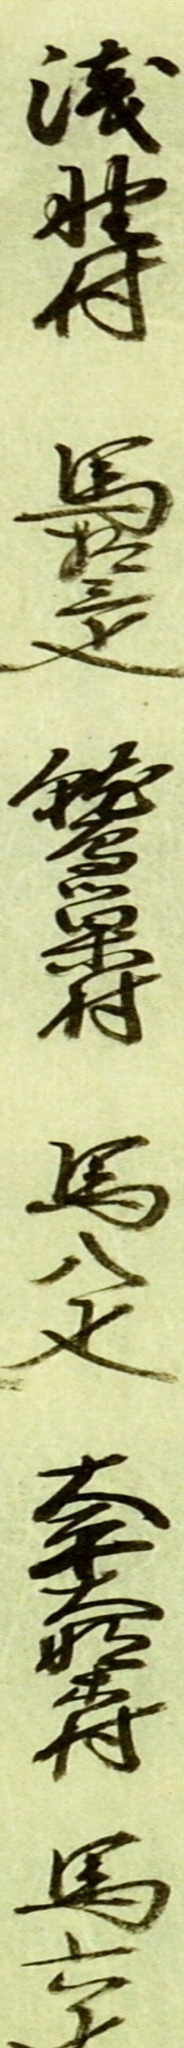浅野村馬拾三疋鷲巣村馬八疋大平大那木村馬六疋
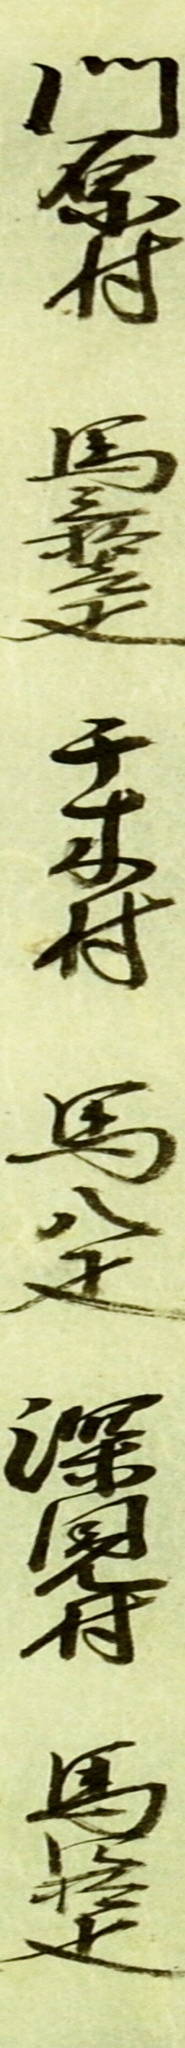門原村馬三拾壱疋千木村馬八疋深見村馬四拾疋
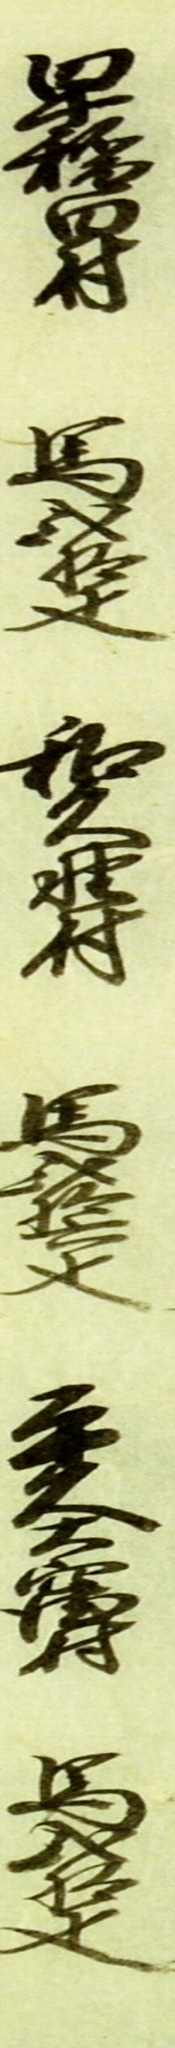早稲田村馬弐拾疋和久野村馬弐拾六疋平久大窪村馬弐拾疋

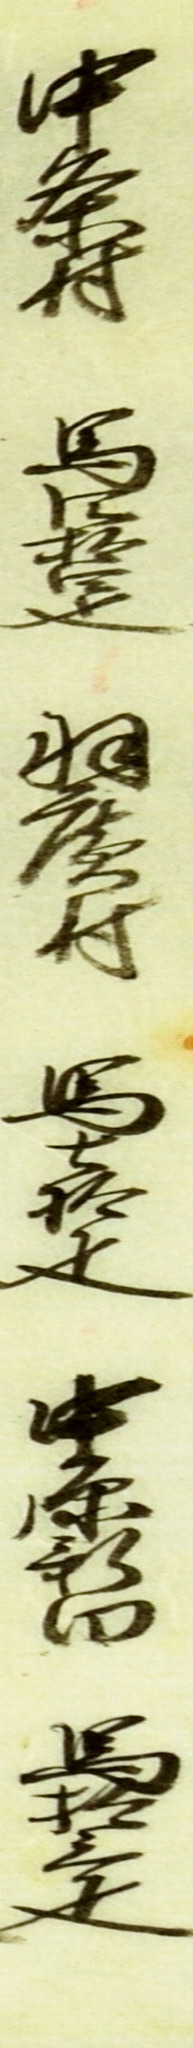中条村馬四拾四疋羽広村馬七拾疋中原新田馬拾三疋
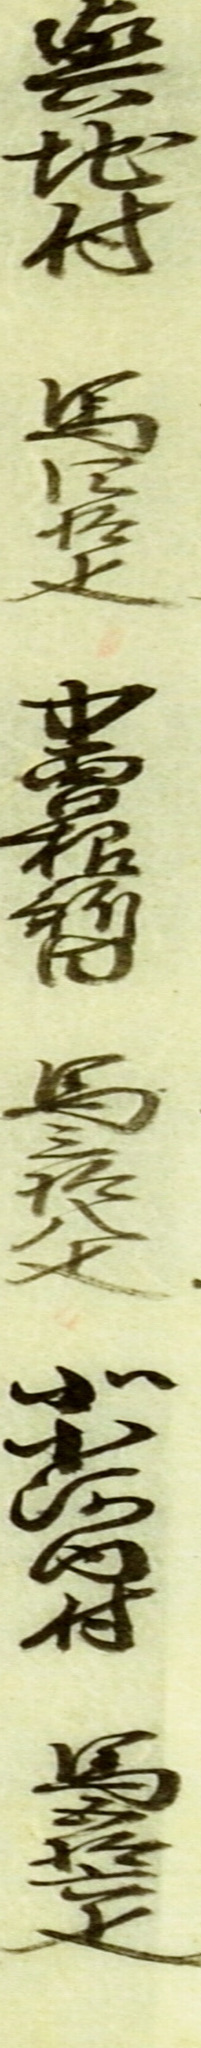与地村馬四拾疋中曾根新田北小河内村馬五拾六疋
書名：中馬荷物并口銭中馬稼之村名馬数等申渡書
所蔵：伊那市立高遠町図書館・合同会社AMANE
